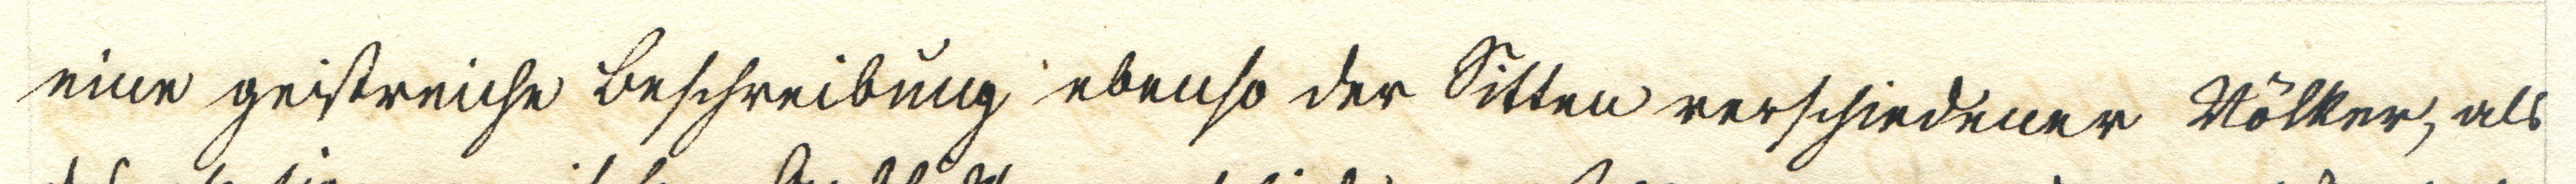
eine geistreiche Beschreibung ebenso der Sitten verschiedener Völker, als
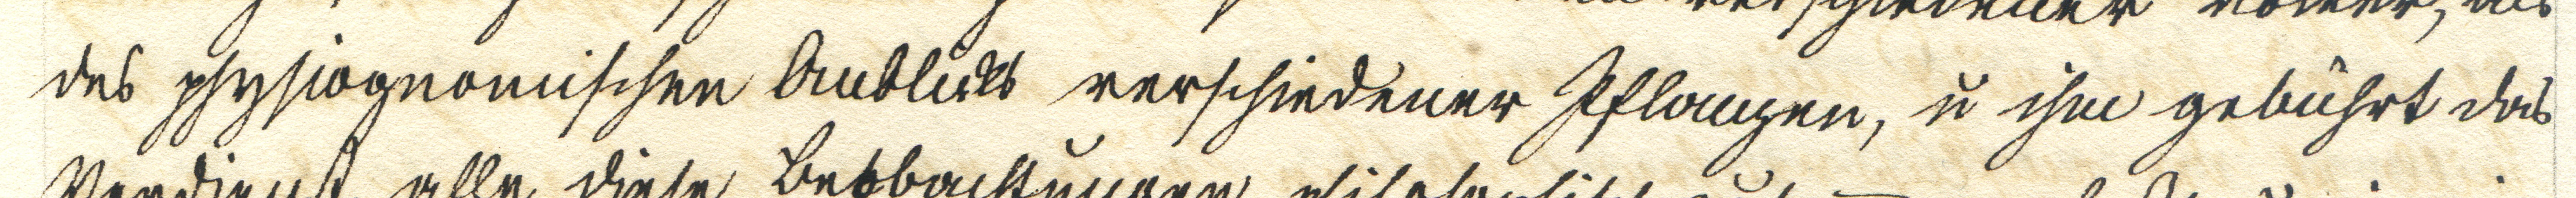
des physiognomischen Anblicks verschiedener Pflanzen, u ihm gebührt das
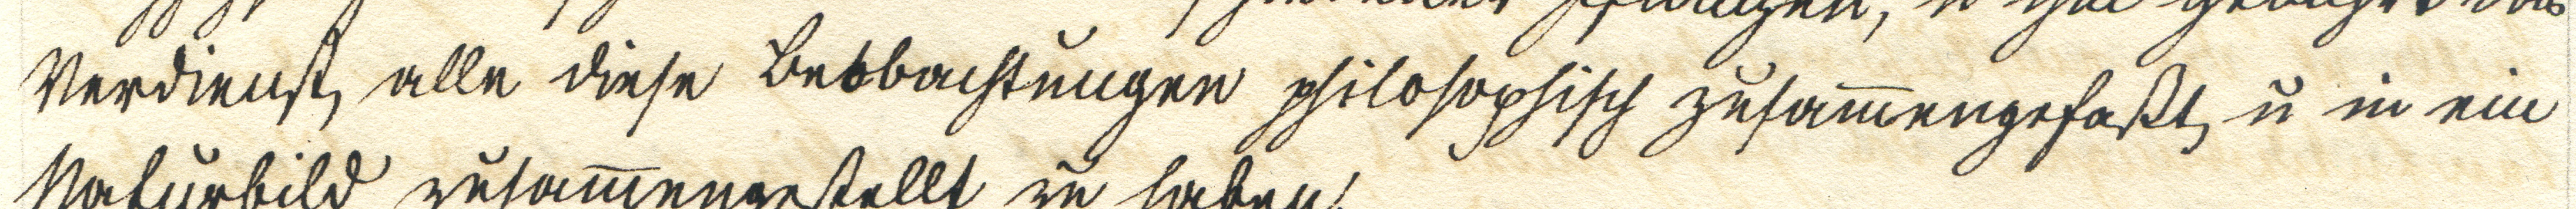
Verdienst, alle diese Beobachtungen philosophisch zusam̃engefaßt, u in ein
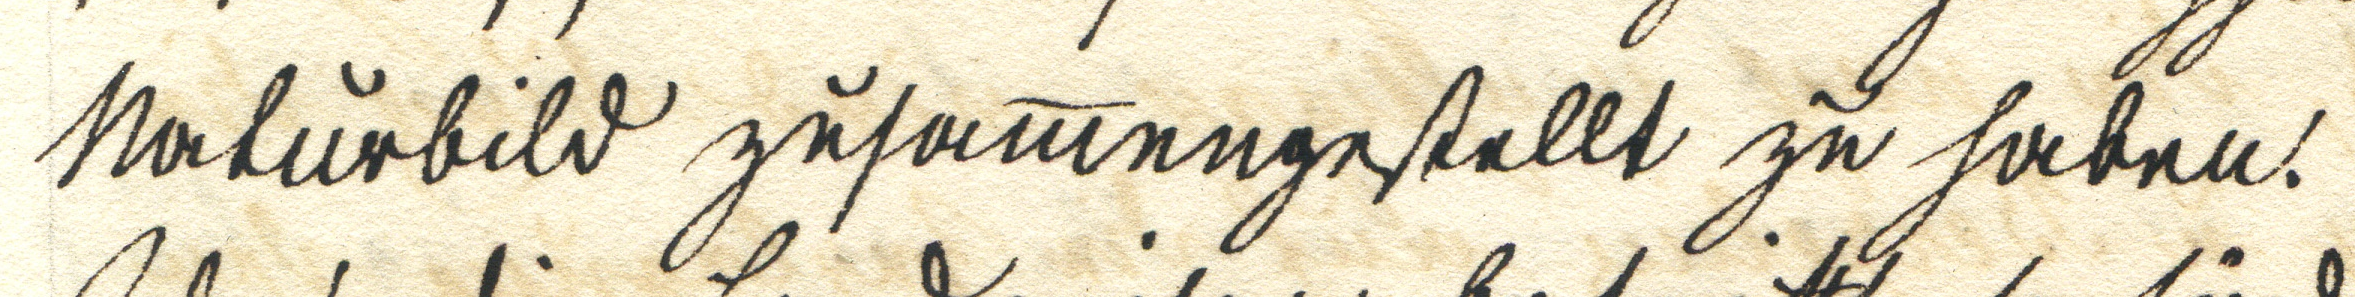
Naturbild zusam̃engestellt zu haben.
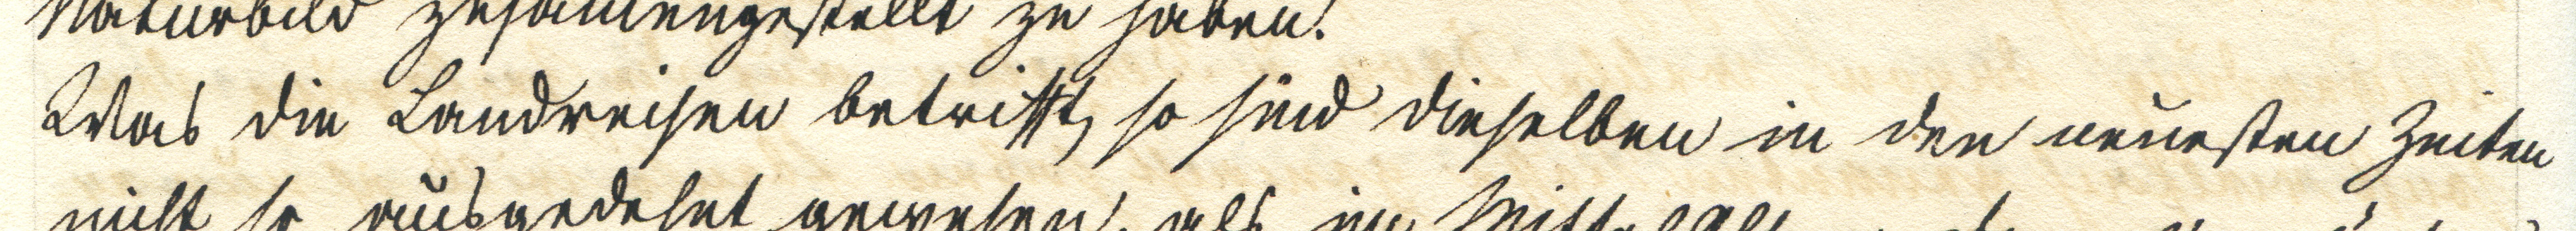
Was die Landreisen betrifft, so sind dieselben in den neusten Zeiten
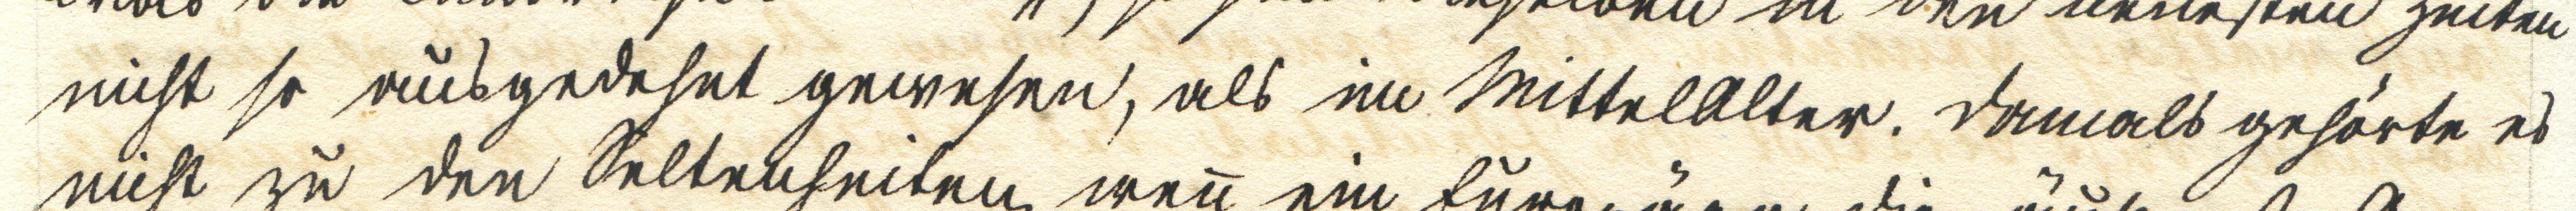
nicht so ausgedehnt gewesen, als im MittelAlter. Damals gehörte es
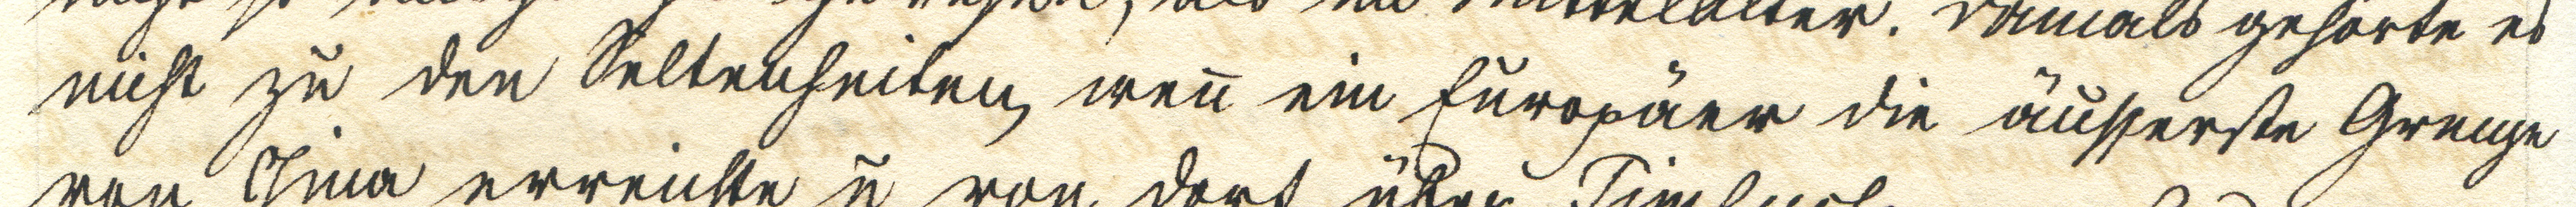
nicht zu den Seltenheiten, weñ ein Europäer die äusserste Grenze
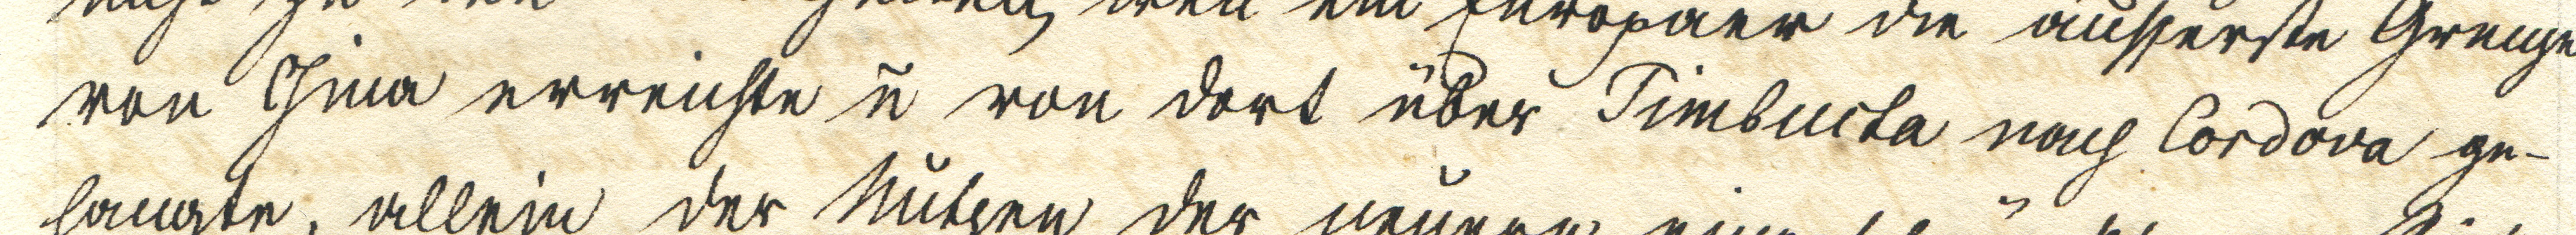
von China erreichte u von dort über Timbucta nach Cordova ge-
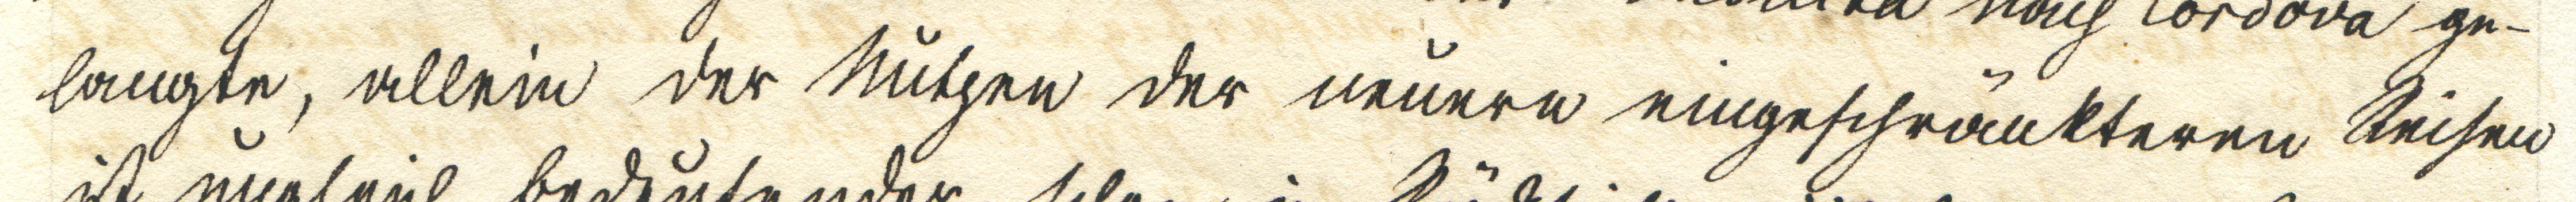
langte, allein der Nutzen der neuern eingeschränkteren Reisen
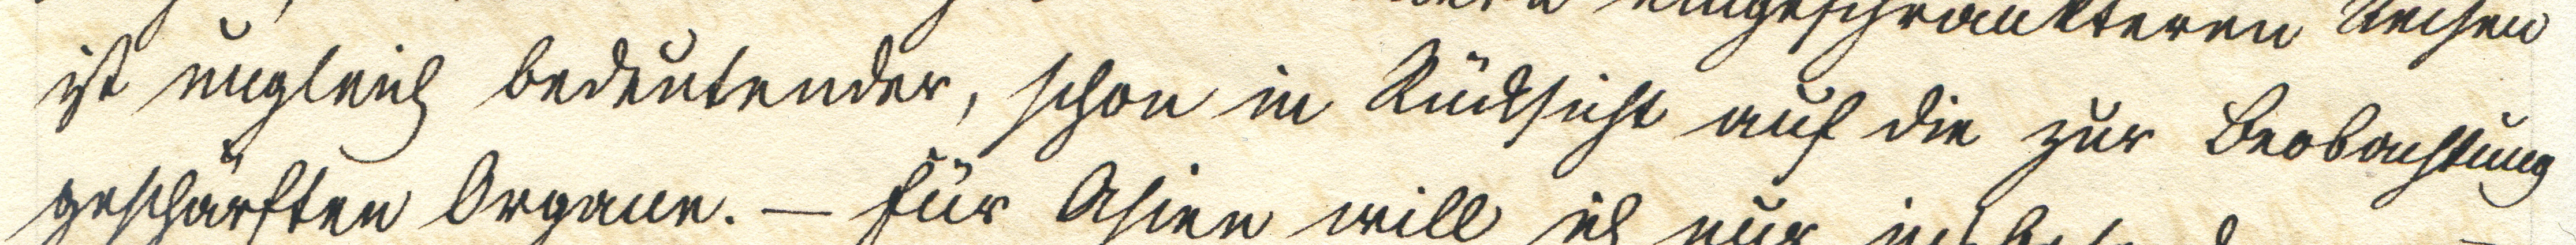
ist ungleich bedeutender, schon in Rücksicht auf die zur Beobachtung
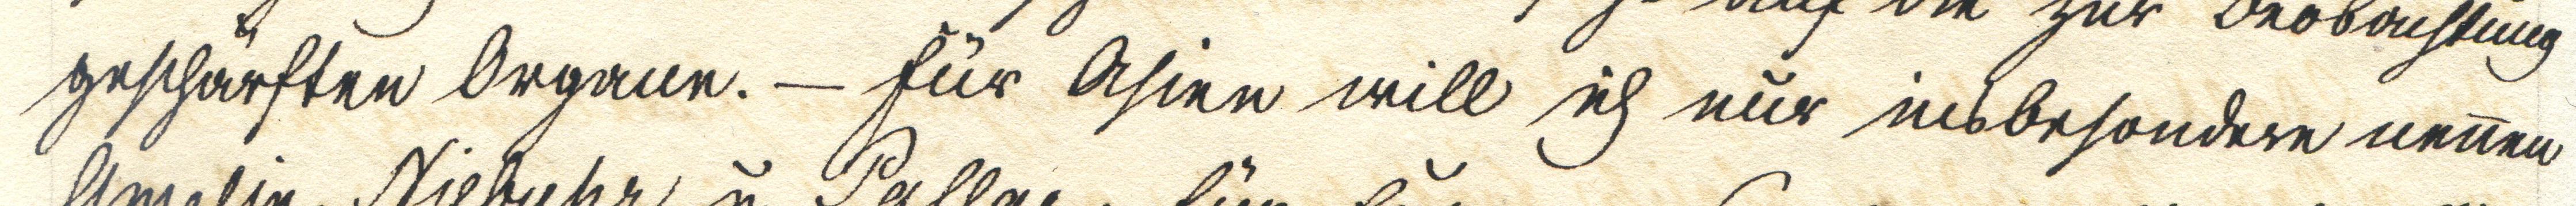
geschärften Organe. – Für Asien will ich nur insbesondere neñen
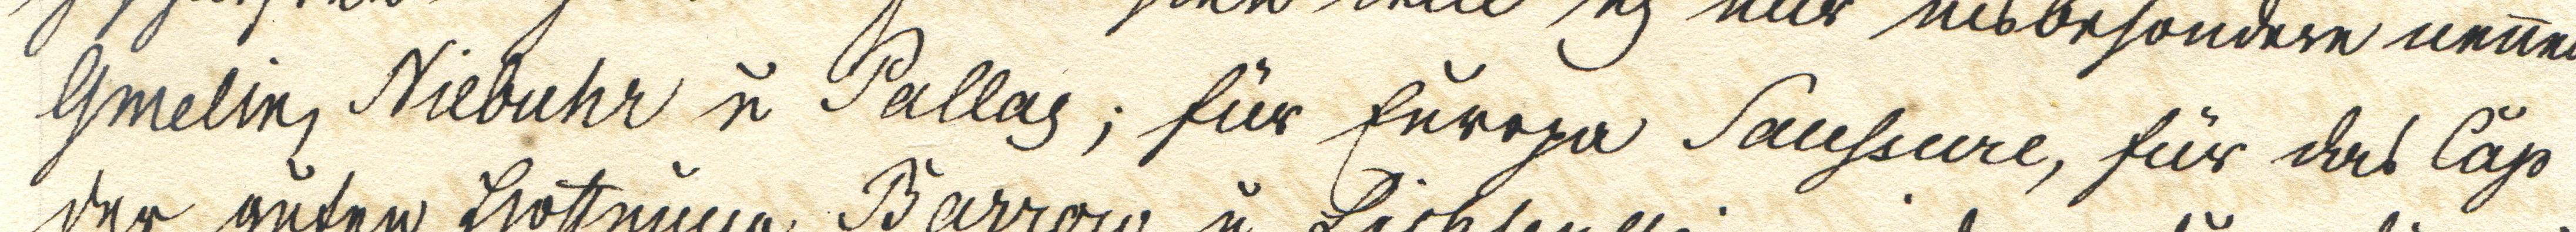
Gmelin, Niebuhr u Pallas; für Europa Saussure, für das Cap
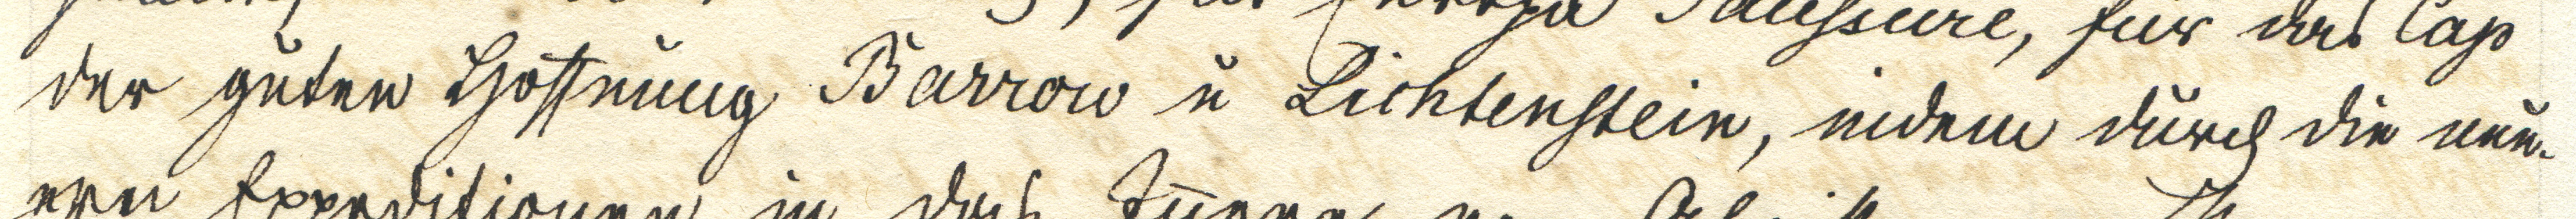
der guten Hoffnung Barrow u Lichtenstein, indem durch die neu-
